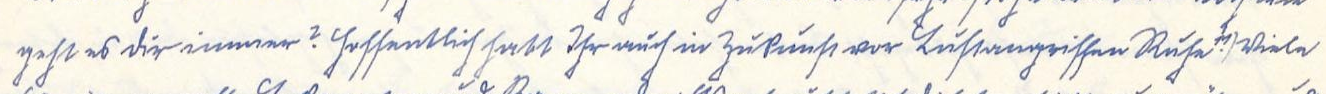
geht es dir immer? Hoffenlich habt Ihr auch in Zukunft vor Luftangriffen Ruhe. 11) Viele
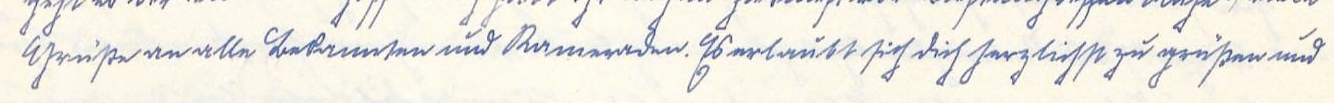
Grüße an alle Bekannten und Kameraden. Es erlaubt sich dich herzlichst zu grüßen und
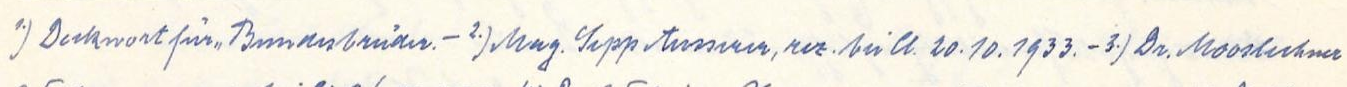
1) Deckwort für „ Bundsbrüder".- 2) Mag. Sepp Ausserer, rez. bei Cl 20.10.1933.- 2) Dr. Mooslechner
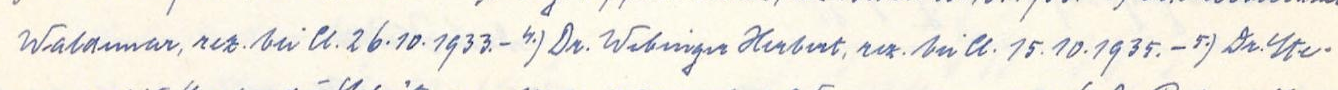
Waldemar, rez. bei Cl.26.10.1933.- 4) Dr. Webinger Herbert, rez. bei Cl.15.10.1935.- 5) Dr Ste-
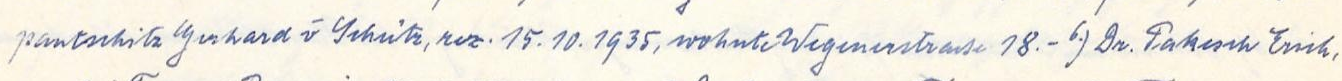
pantschitz Gerhard v/o Schütz, rez. 15.10.1935, wohnte Wegenerstraße 28.- 6) Dr. Pakesch Erich,
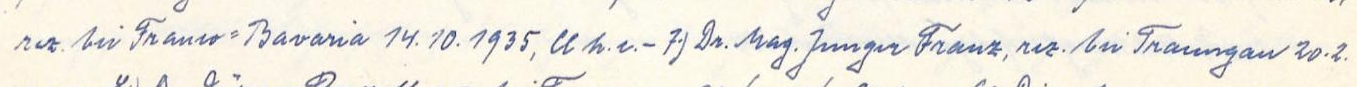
rez. bei Franco-Bavaria 14.10.1935, Cl. h.c. 7) Dr. Mag. Junger Franz, rez. bei Traungau 20.2.
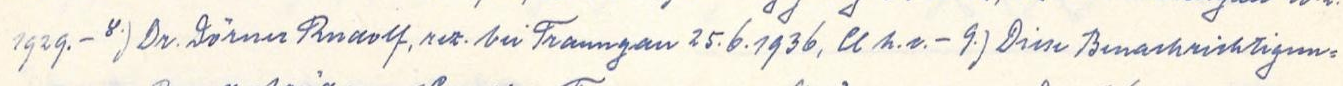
1929.- 8) Dr. Dörner Rudolf, rez. bei Traungau 25.6.1936, Cl h.c.- 9) Diese Benachrichtigun-
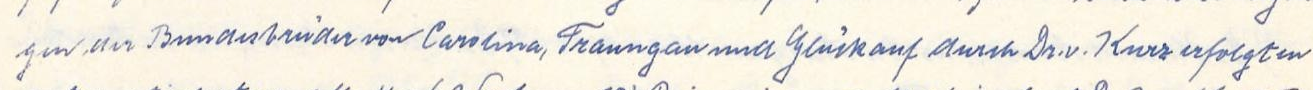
gen der Bundesbrüder von Carolina, Traungau und Glückauf durch Dr. v. Kurz erfolgten
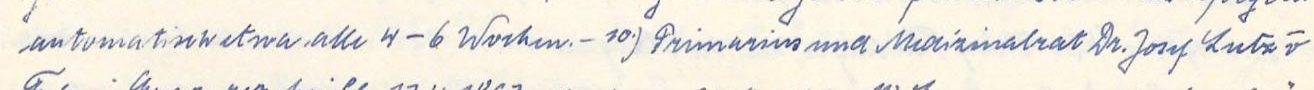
automatisch etwa alle 4-6 Wochen.- 10) Primarius und Medizinalrat Dr. Josef Lutz v/o
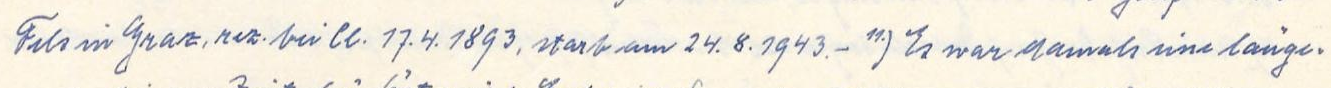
Fels in Graz, rez. bei Cl.17.4. 1893, starb am 24. 8. 1943.- 11) Es war damals eine länge-
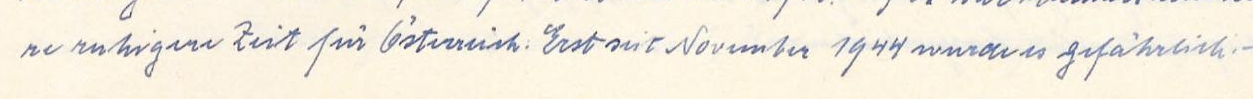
re ruhigen Zeit für Österreich. Erst seit Nomber 1944 wurde es gefährlich.-
